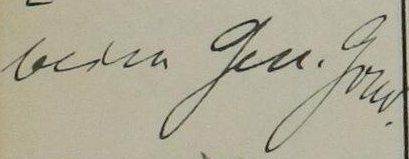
beim Gen. Gouv.
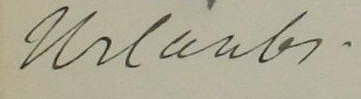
Urlaubs
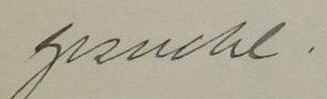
gesuche
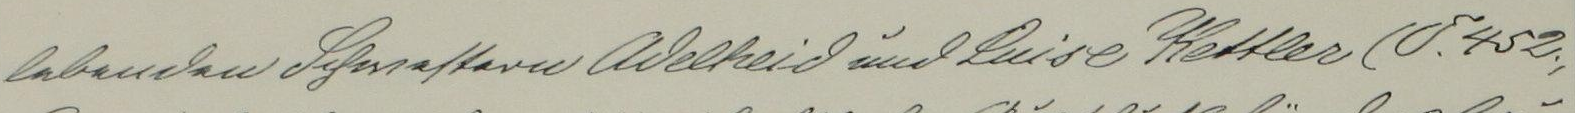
lebenden Schwestern Adelheid und Luise Kettler (T.452;
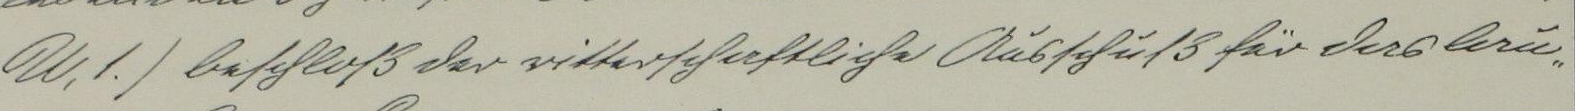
U.1) beschloß der ritterschaftliche Ausschuß für das lau-
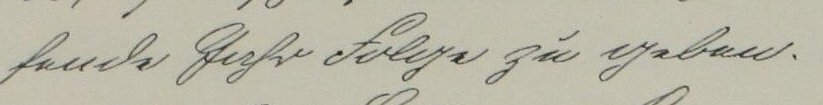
fende Jahr Folge zu geben.
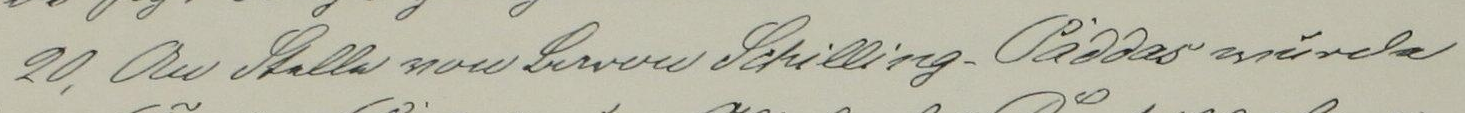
20. An Stelle von Baron Schilling-Paddas wurde
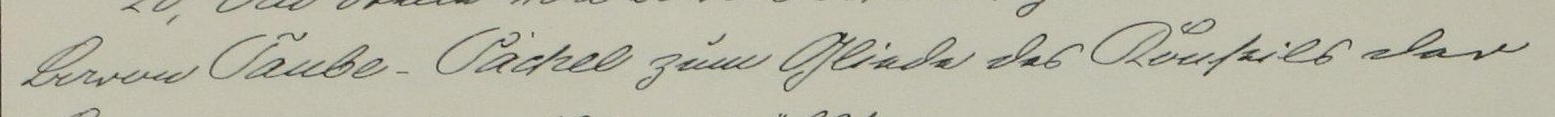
Baron Taube-Pachel zum Gliede des Konseils der
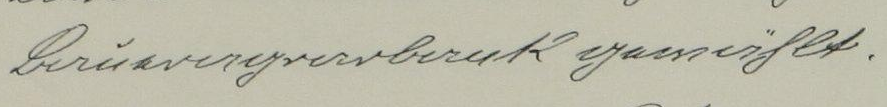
Baueragrarbank gewählt.
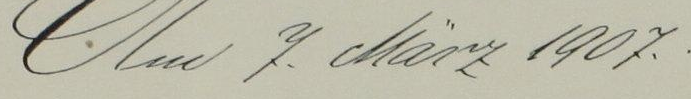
Am 7. März 1907.
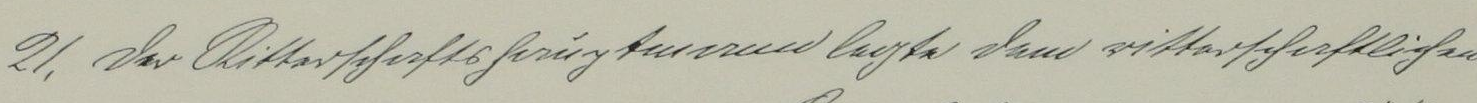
21. Der Ritterschaftshauptmann legte dem ritterschaftlichen
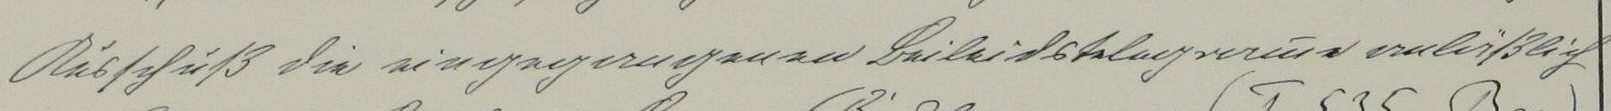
Ausschuß die eingegangenen Beileidstelegramme anläßlich
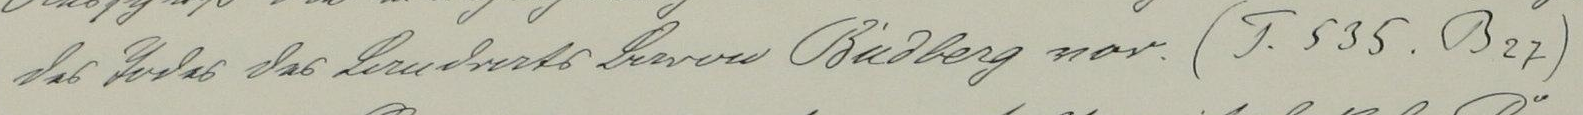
des Todes des Landrats Baron Budberg vor. (T.535. B 27)
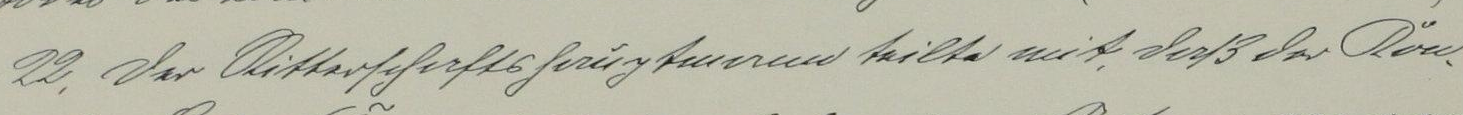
22. Der Ritterschaftshauptmann teilte mit, daß der Kon-
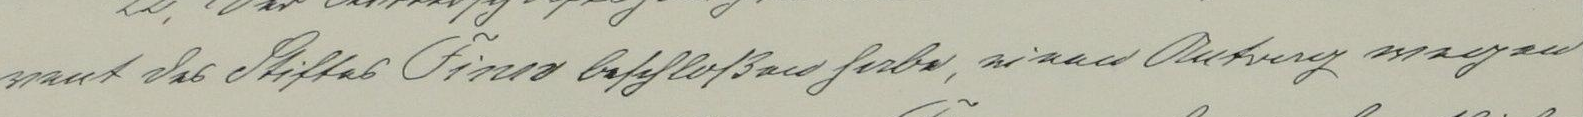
vent des Stiftes Finn beschloßen habe, einen Antrag wegen
